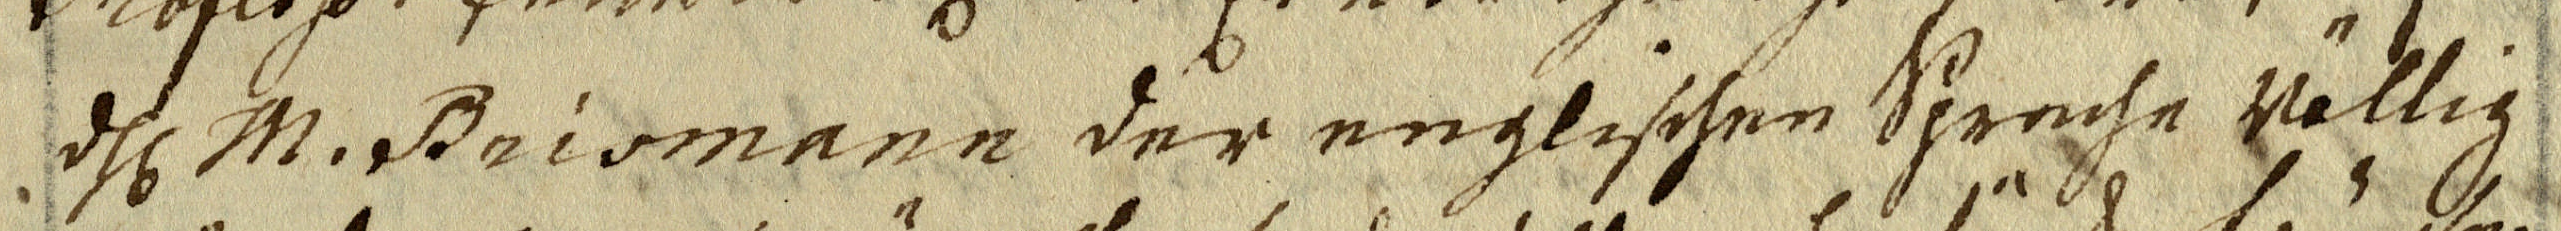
dh. M. Brismann der englischen Sprache völlig
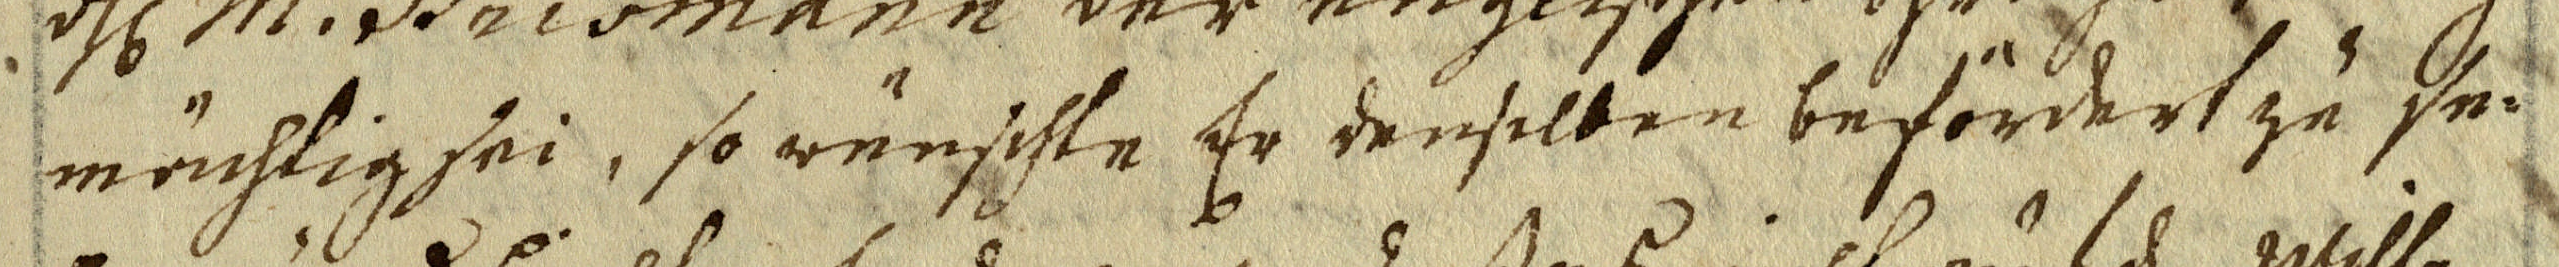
mächtig sei, so wünschte Er denselben befördert zu se¬
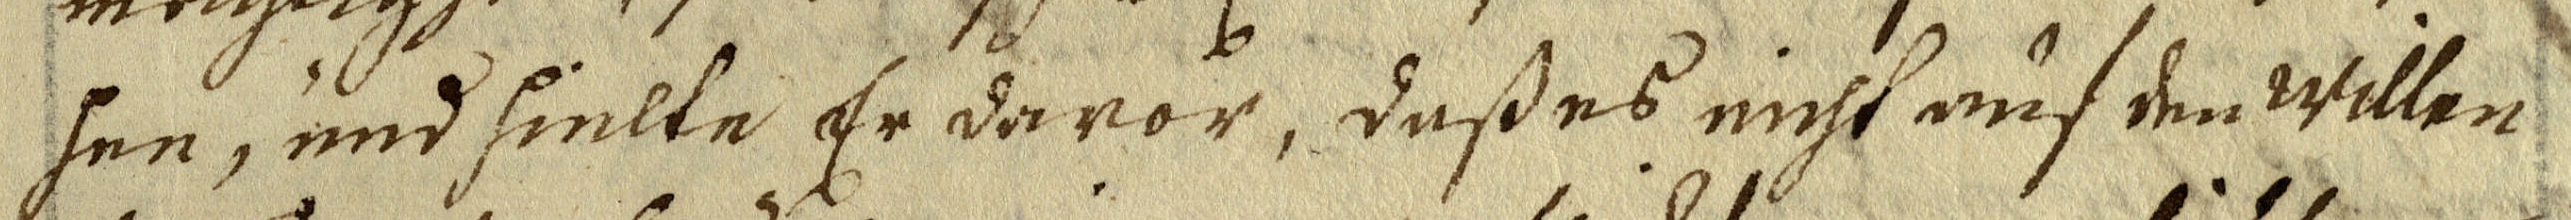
hen, und hielte Er davor, daß es nicht auf den Willen
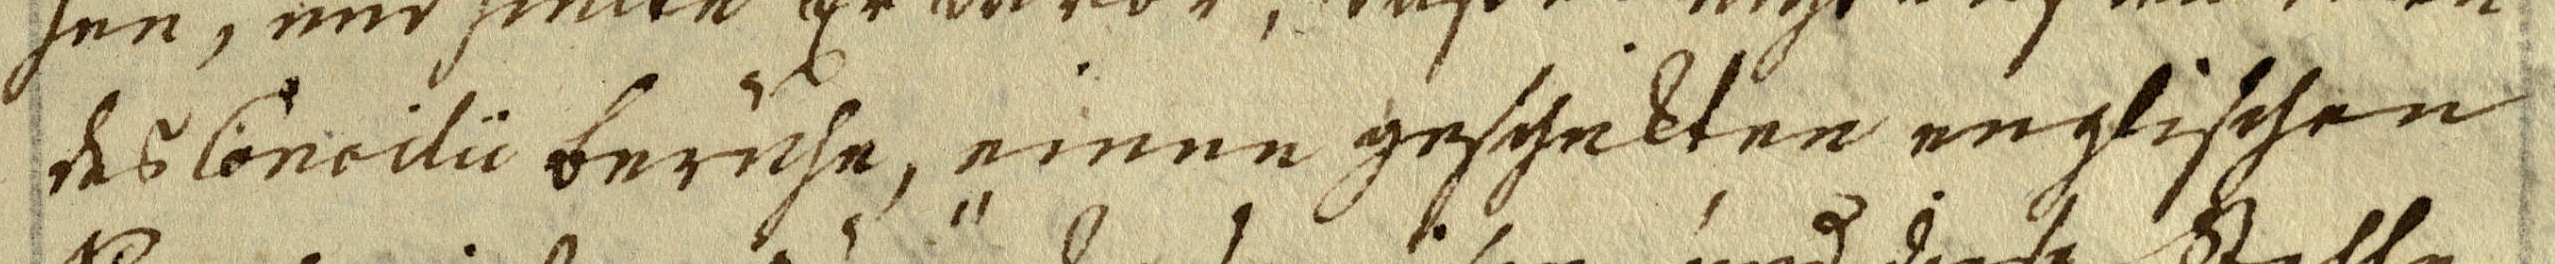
des Concilio beruhe, einen geschickten englischen
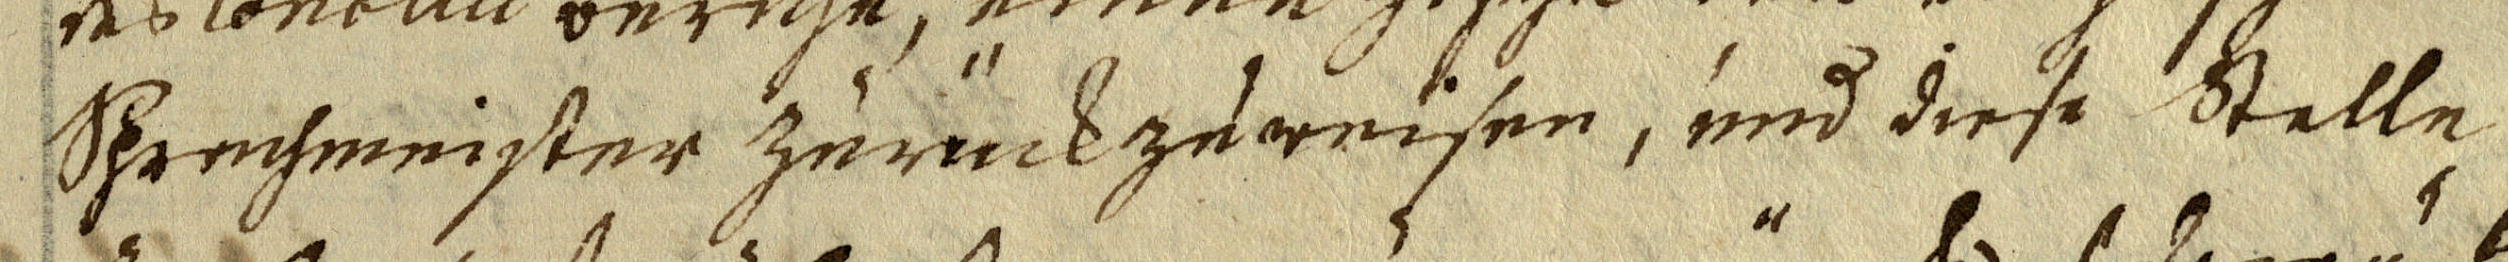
Sprachmeister zurückzuweisen, und diese Stelle
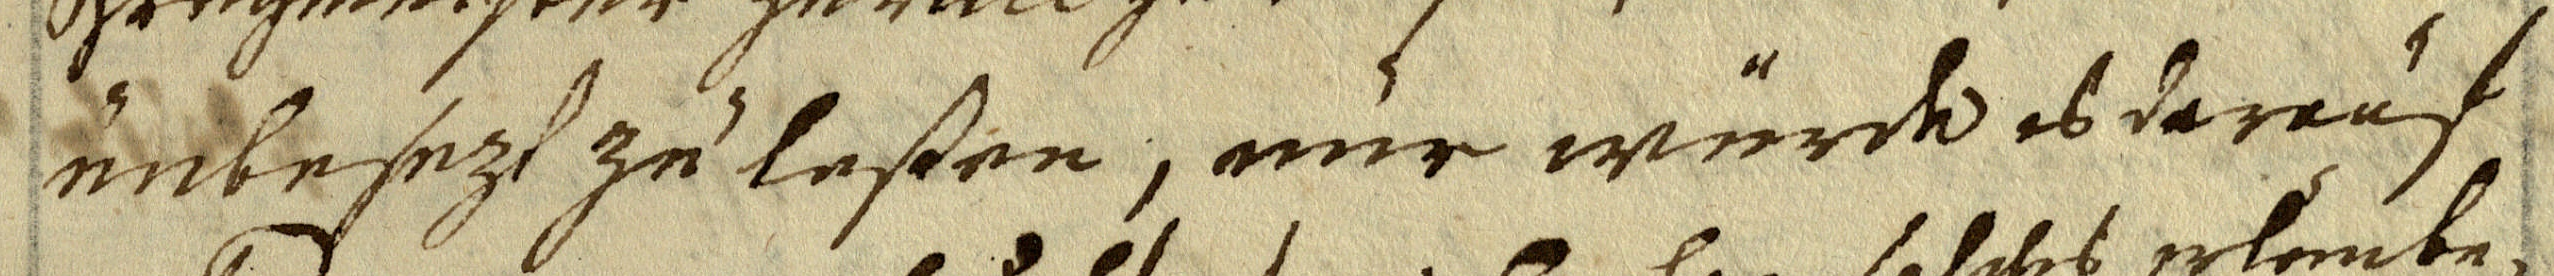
unbesezt zulaßen, nur würde es darauf
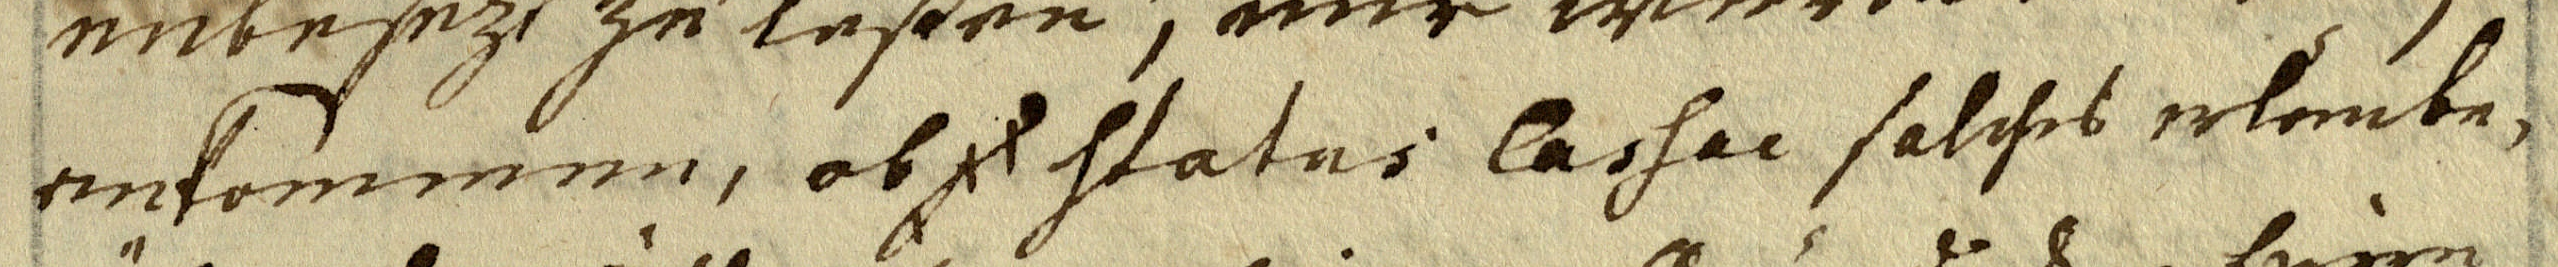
ankommen, ob Status Cassae solches erlaube,
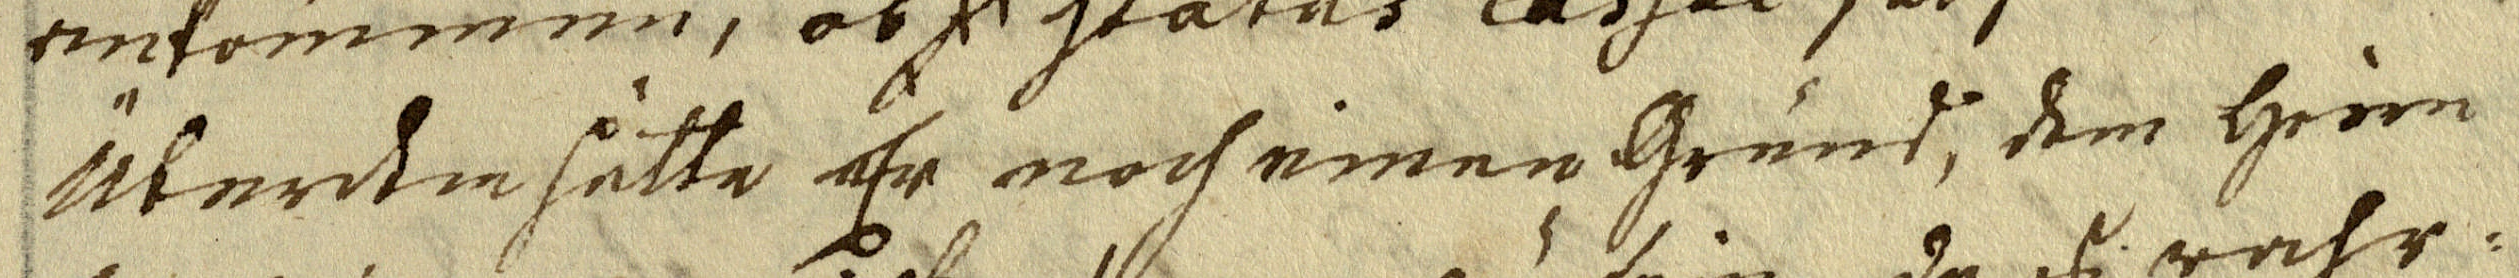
Überdem hätte Er noch einen Grund, dem Herrn
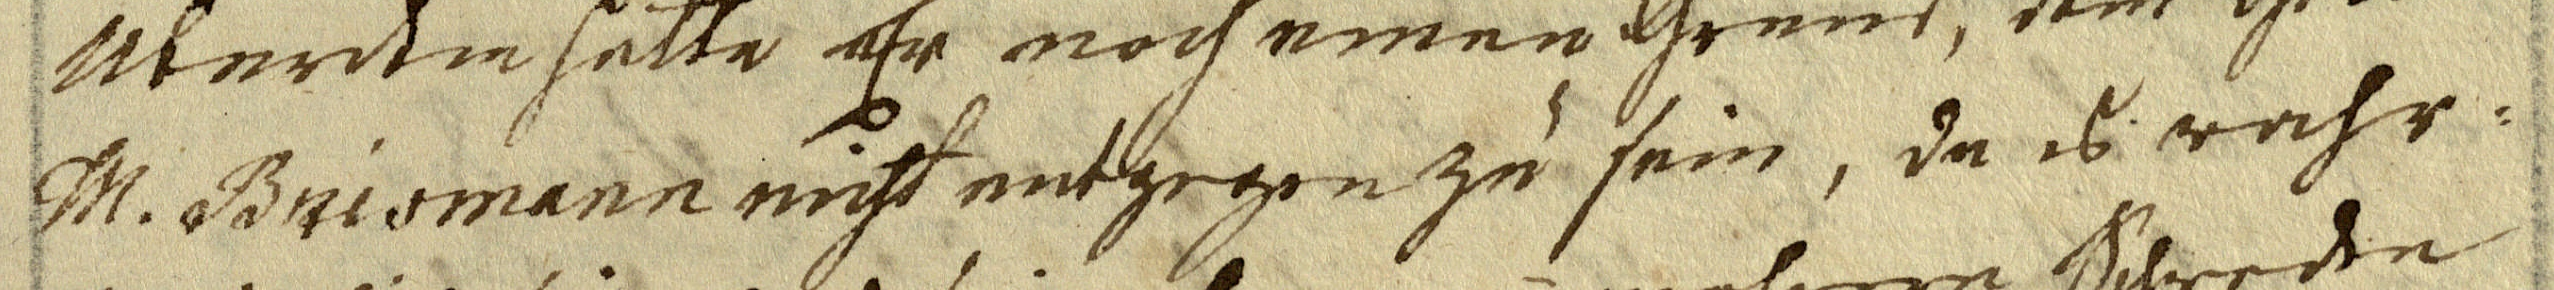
M. Brismann nicht entgegen zu sein, da es wahr¬
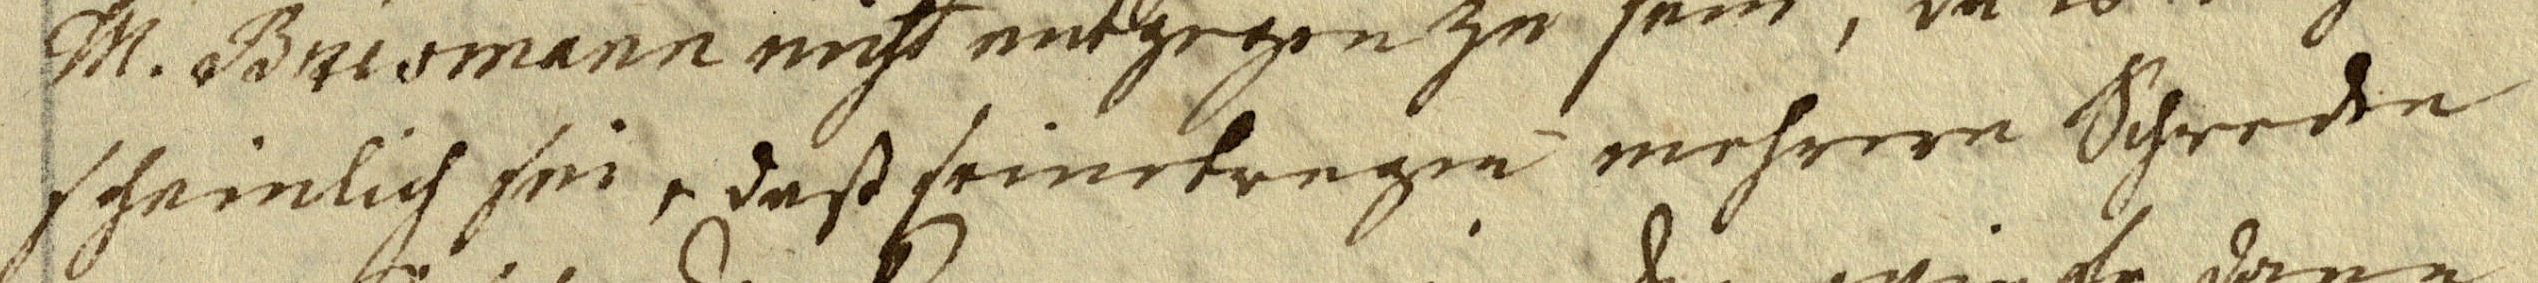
scheinlich sei, daß seinetwegen mehrere Schweden
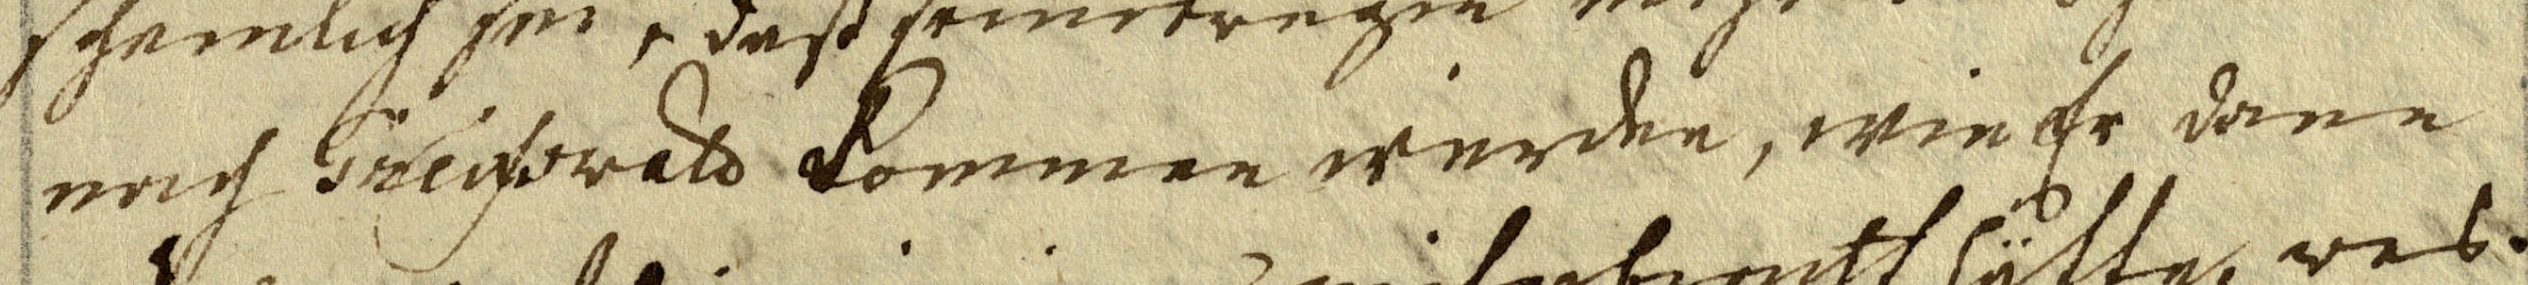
nach Greifswald kommen werden, wie Er dann
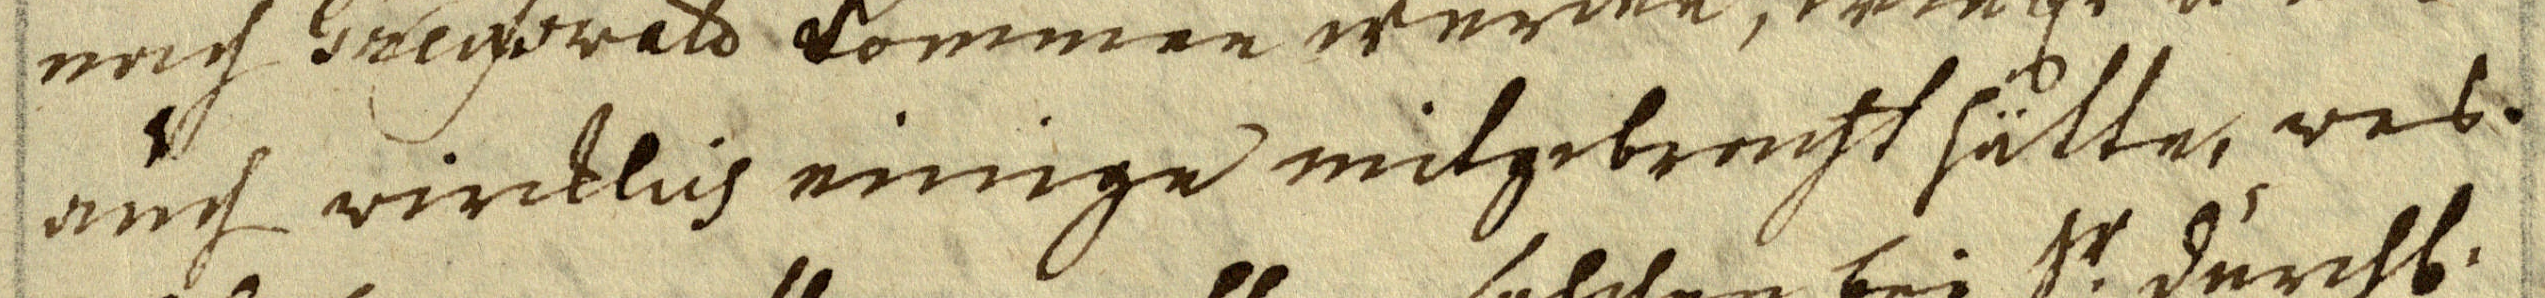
auch wircklich einige mitgebracht hätte, wes¬
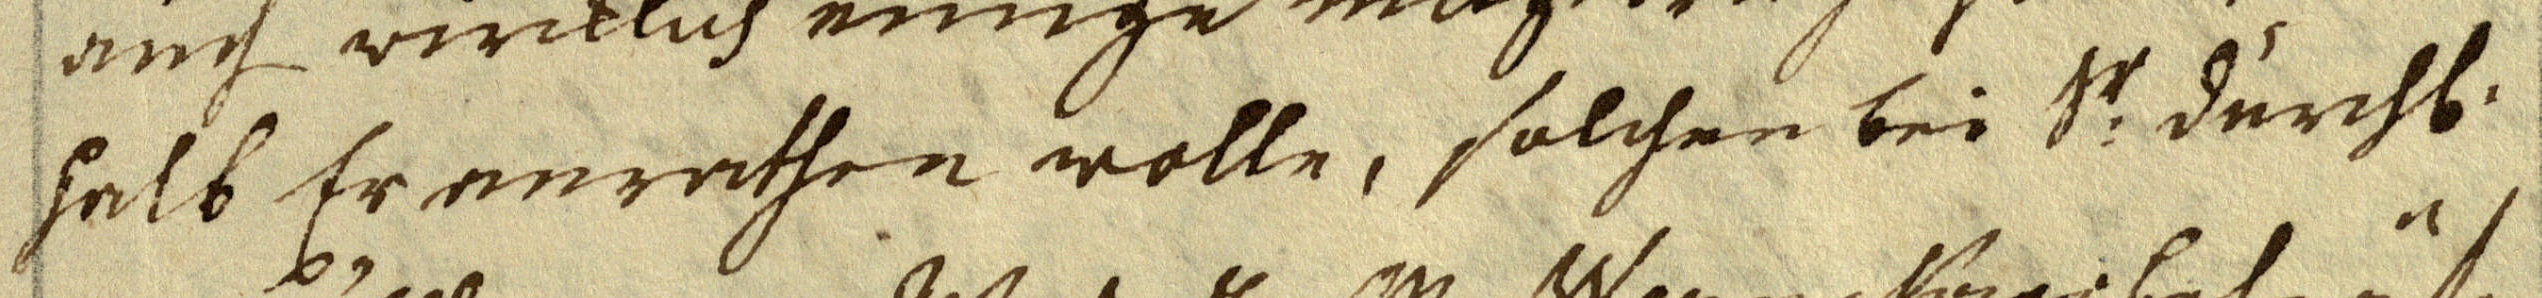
halb Er anrathen wolle, solchen bei Sr Durchl.
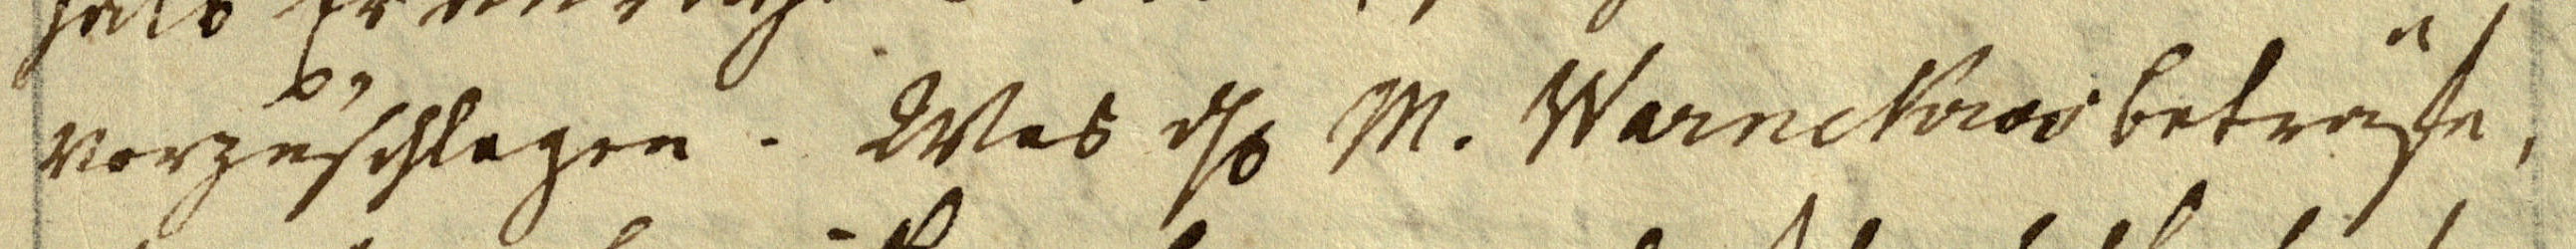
vorzuschlagen. Was dh M. Warnekros beträfe,
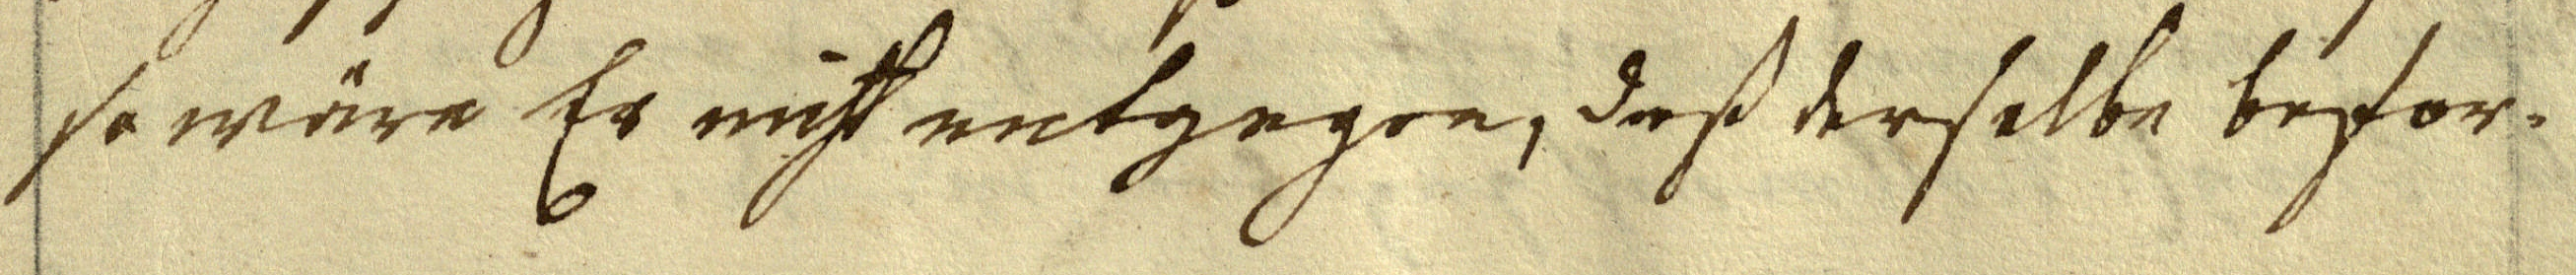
so wäre Er nicht entgegen, daß derselbe befor¬
